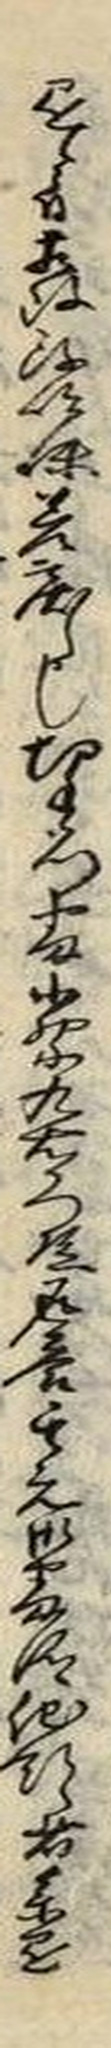懸候ニ付相改致吟味差戻し申候切手御門番小栗九右衛門殿返答其元御番所へ他領之者参懸
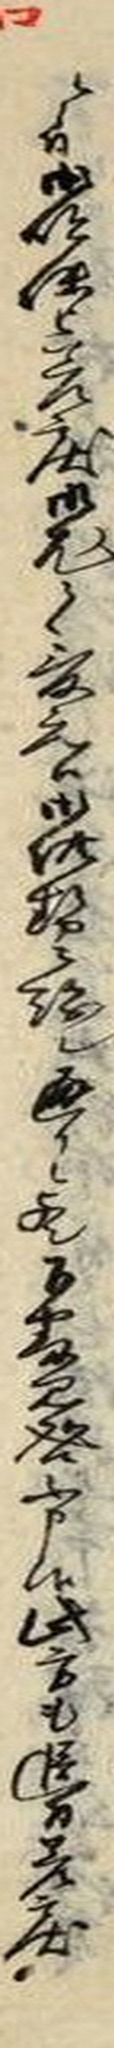候に付御吟味被差戻御尤ニ候爰元は御供勢に紛レ通り候歟下番見咎不申候此方も追付差戻

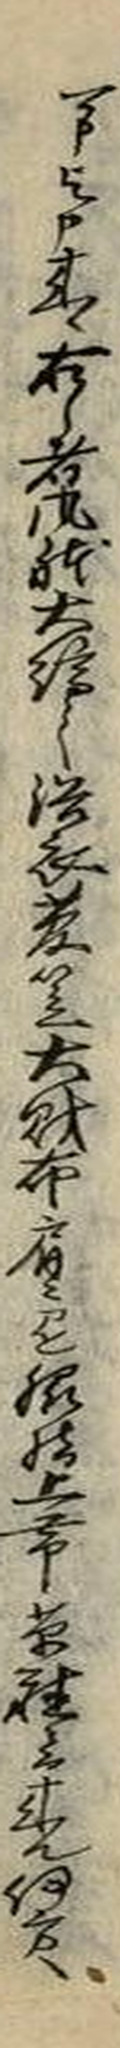可申と申来候右之者風体大縮之浴衣菅笠大財布肩に懸脇差上帯草鞋に而来候何方へ
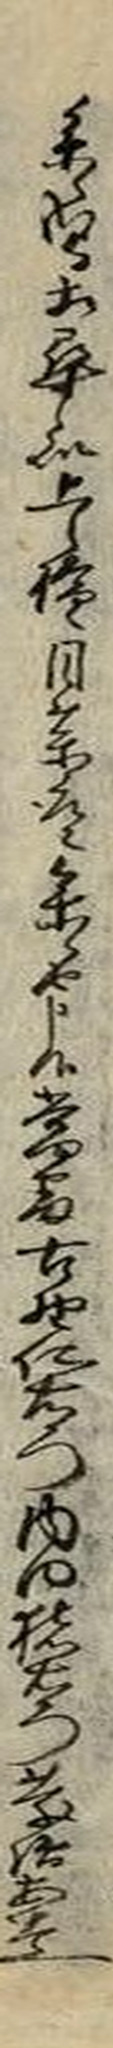参候哉と相尋候処上之橋へ目薬取に参候由申候当番古野仁右衛門内田猪右衛門慶増安太夫
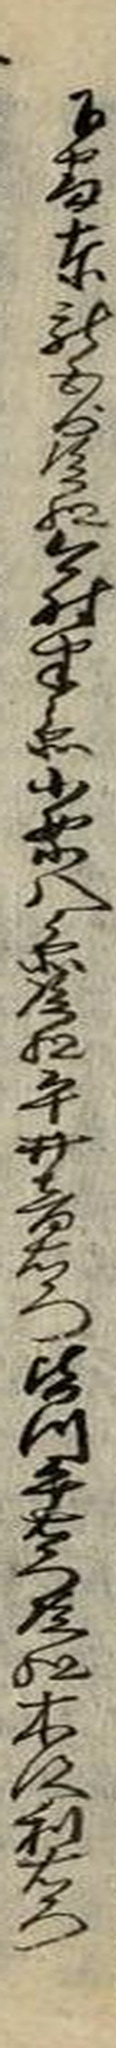下番東新五右衛門殿組今村半兵衛小栗八兵衛殿組平井音右衛門皆川平右衛門殿組木沢利右衛門
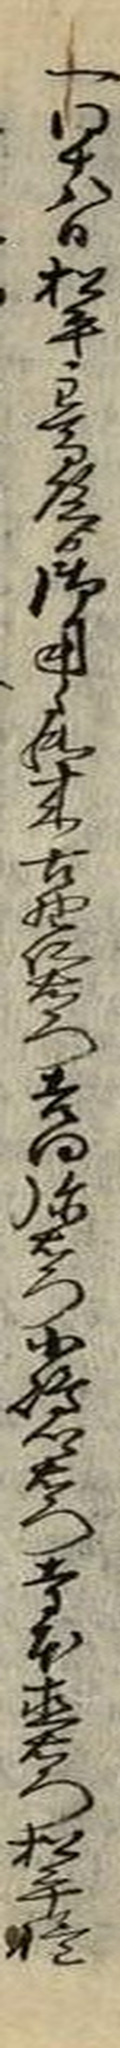一同十八日松平主馬殿ゟ御用手紙来古野仁右衛門吉田弥右衛門小林郷右衛門寺本直右衛門松平軽
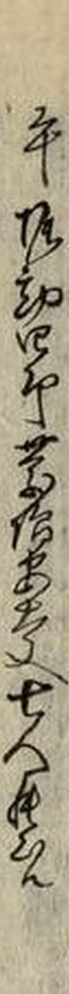平堀勘四郎慶増安太夫七人罷出候
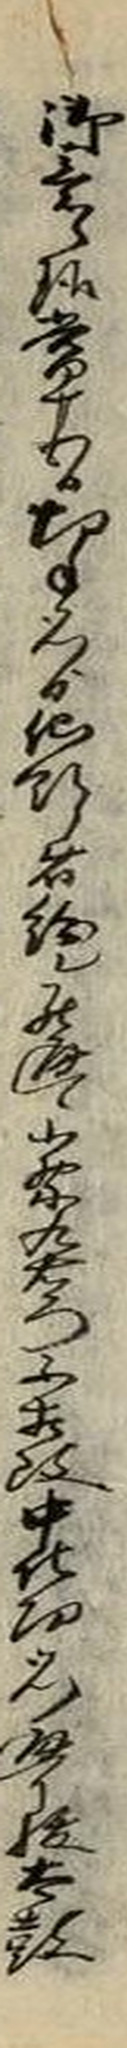御意之趣当十五日切手御門ゟ他領之者紛れ罷通候小栗九右衛門不相改中仕切御門通り抜太鼓
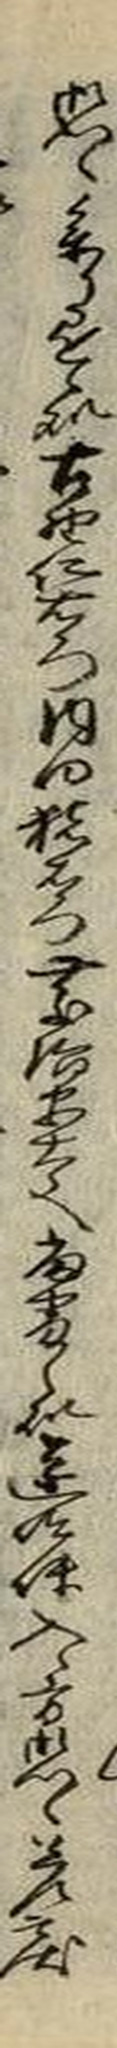御門へ参り懸候処古野仁右衛門内田猪右衛門慶増安太夫当番之処遂吟味入候方御門へ差戻
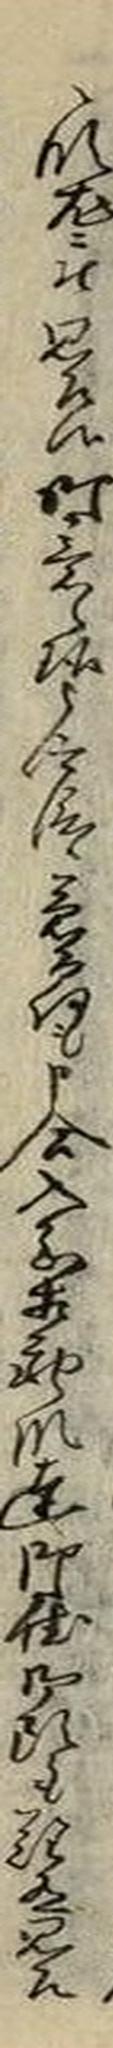候段尤に被思召候御意之趣被仰渡候兼而何も申合入念相勤候段達御聴御頭へも難有思召
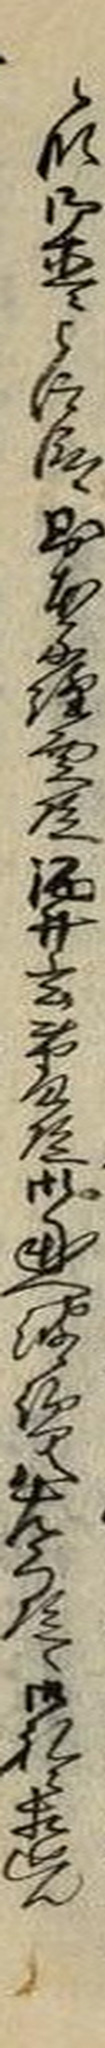候段御直々被仰渡候則本多縫殿殿酒井玄蕃殿御用人波々伯部八左衛門殿へ御礼に相廻ル
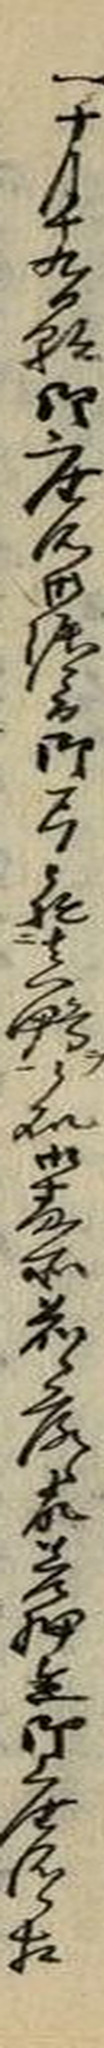一十月十九日朝御座所御張に而御弓真鴨ヲ被遊候処御番所前へ落候故差押置御座所へ相
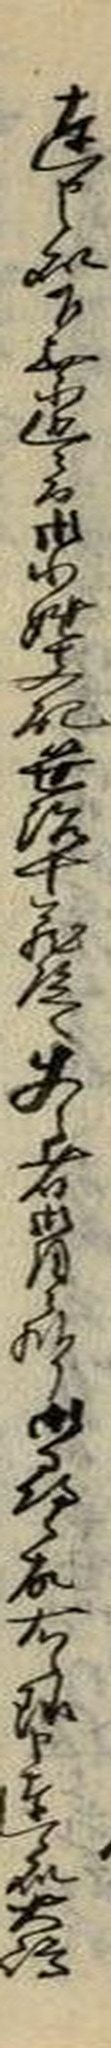達申候処下乗辺に而御小姓支配笹治十蔵殿へ使之者御目に掛り御尋候故右之趣申達候処大嶋
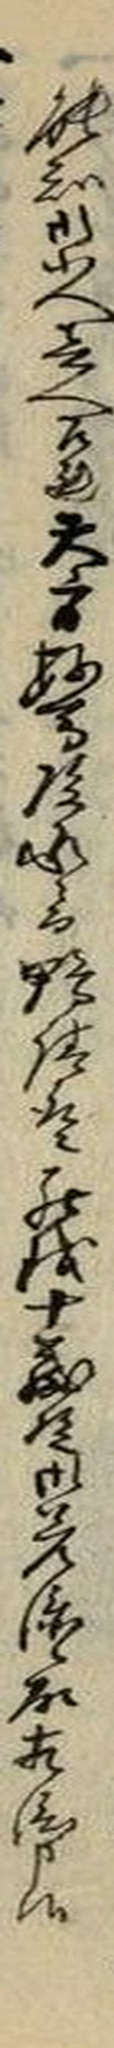能知御小人壱人召連天方数馬殿承に而鴨請取に罷越十蔵殿御差添候故相渡申候
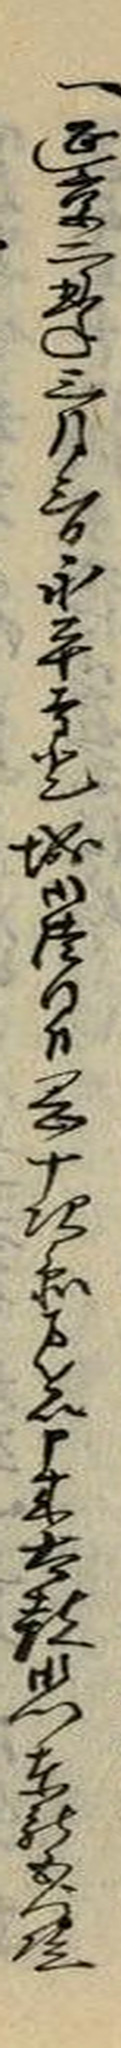一延享二丑年三月三日永平寺登城御徒目付岡十次兵衛方を以申来太鼓御門東新五右衛門殿
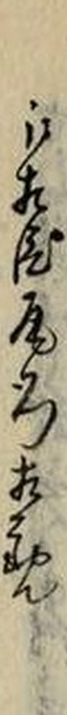江相渡瓦御門相勤ル
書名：御門御櫓之部
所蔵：福井県文書館 Fukui Prefectural Archives
